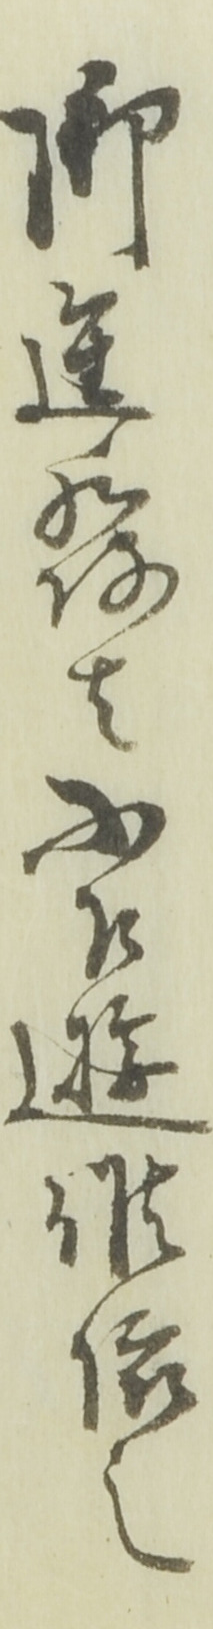御進発者不被遊候依之
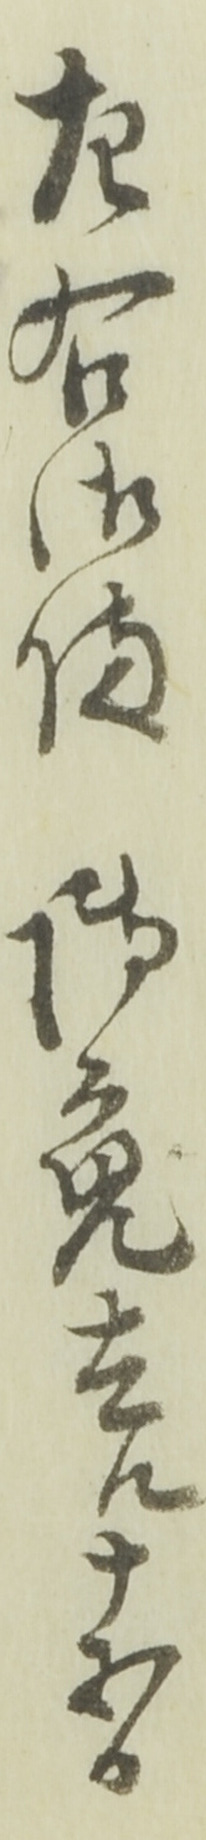左右御備御免去ル十五日
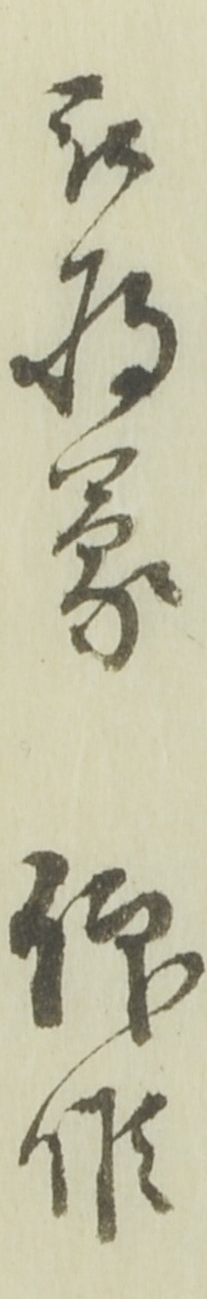被為蒙仰候
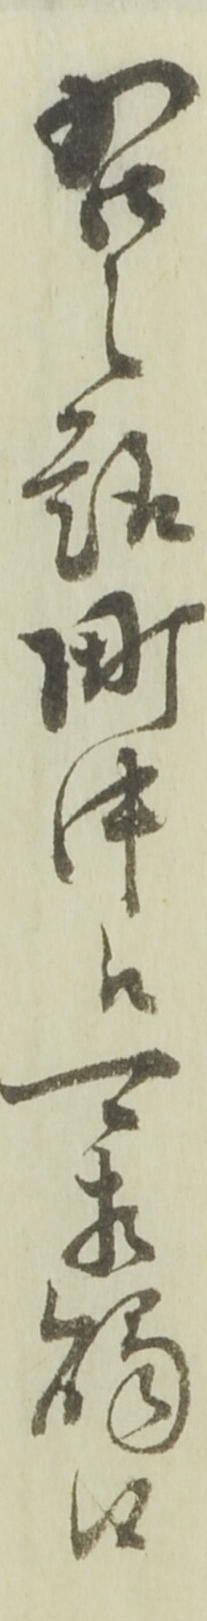右之趣町中江可相触曽候
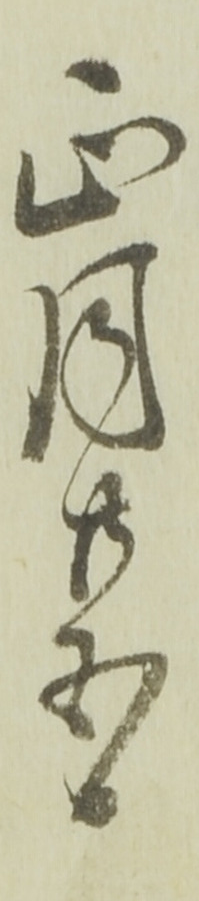正月廿五日
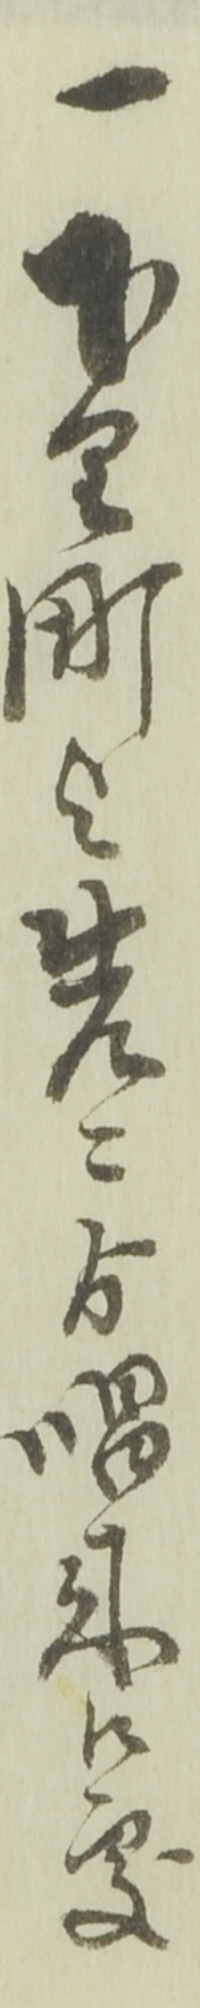一下モ町と先々ゟ唱来候処
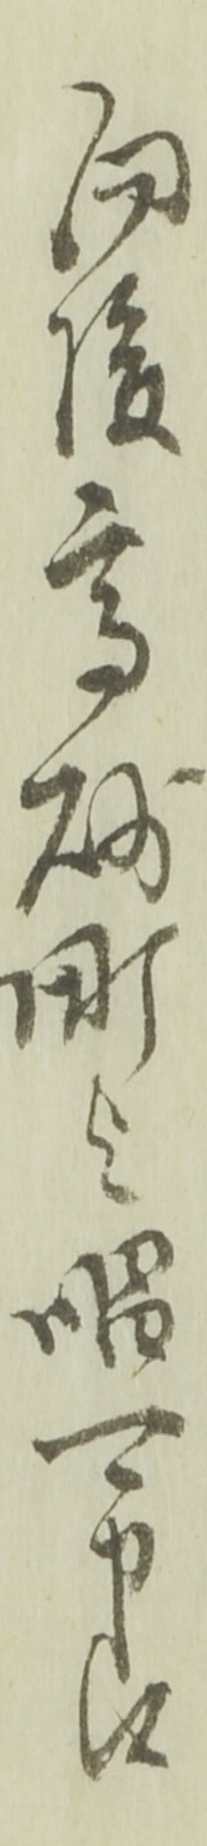向後高砂町と唱可申候
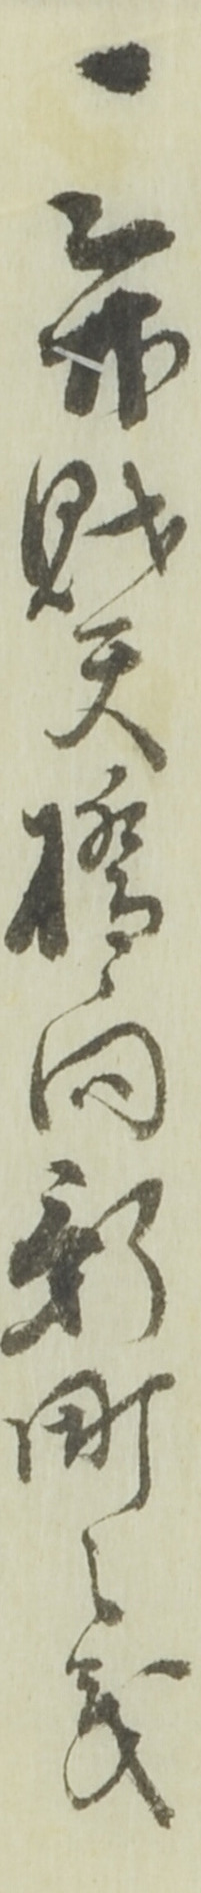一弁財天橋向新町之義
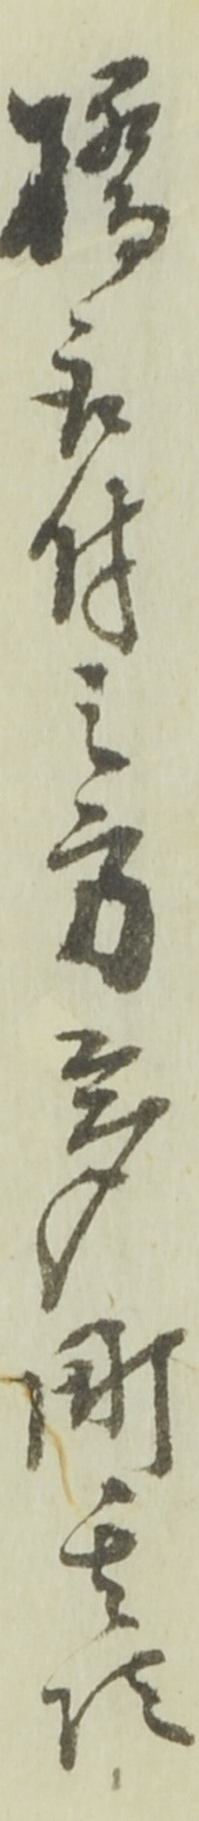橋取付之方多町其頃
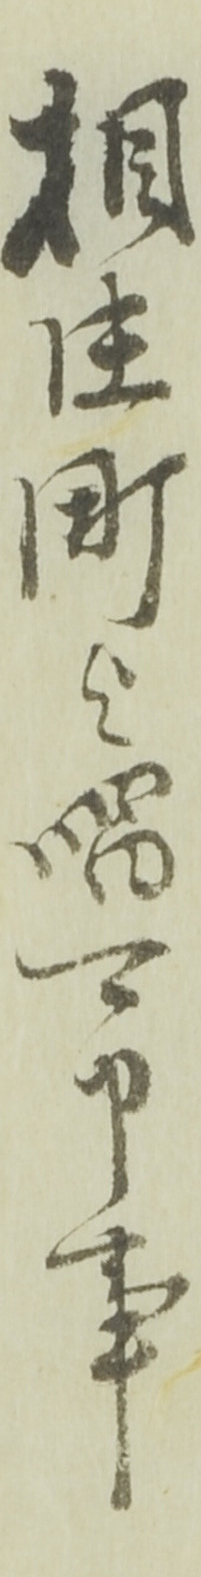相生町と唱可申事
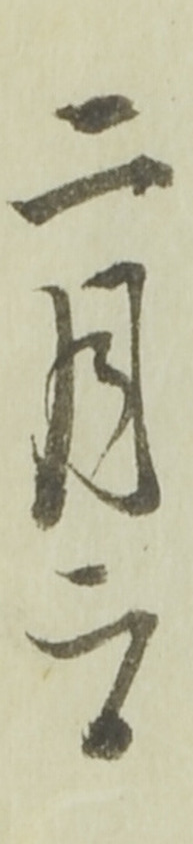二月二日
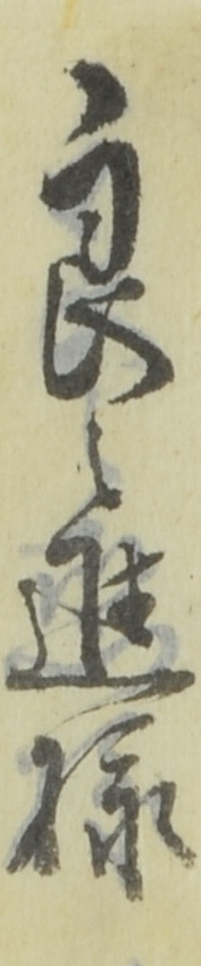良之進様
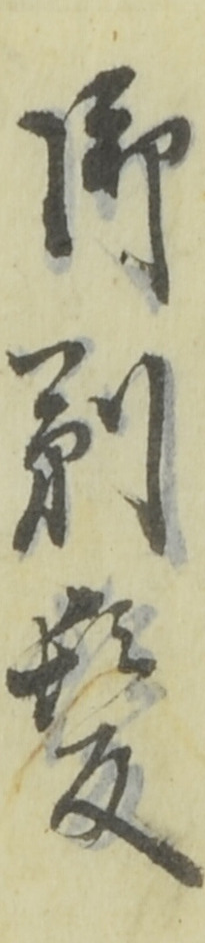御剃髪
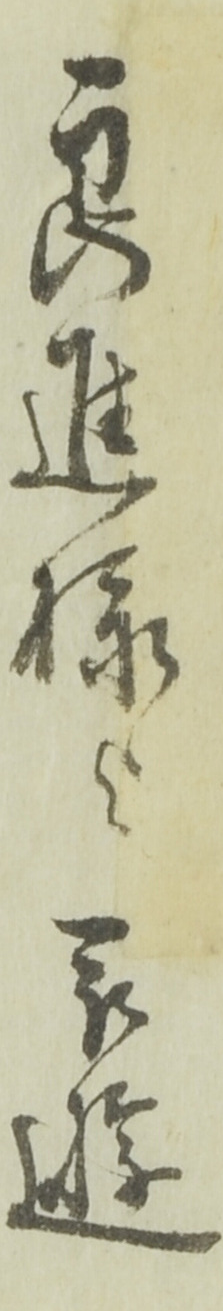良進様と被遊
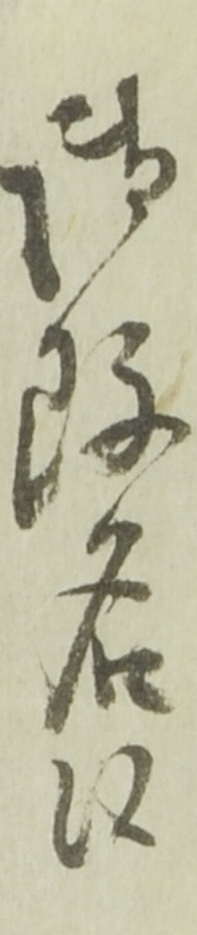御改名候

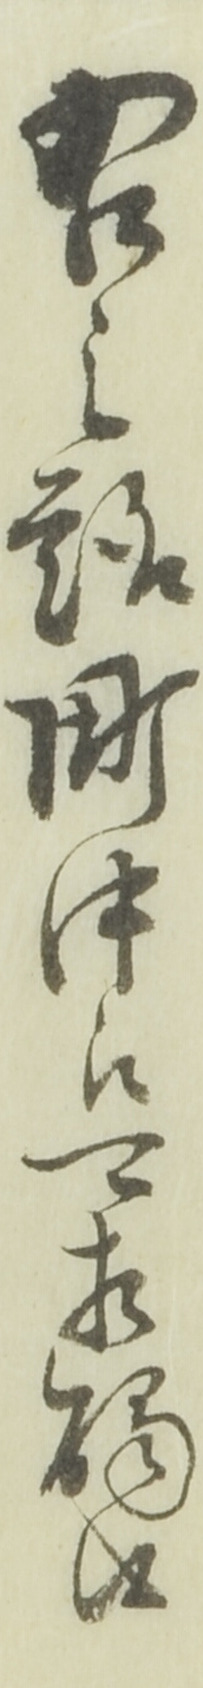右之趣町中江可相触候
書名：御触書御書附控帳
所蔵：伊那市立高遠町図書館・合同会社AMANE
